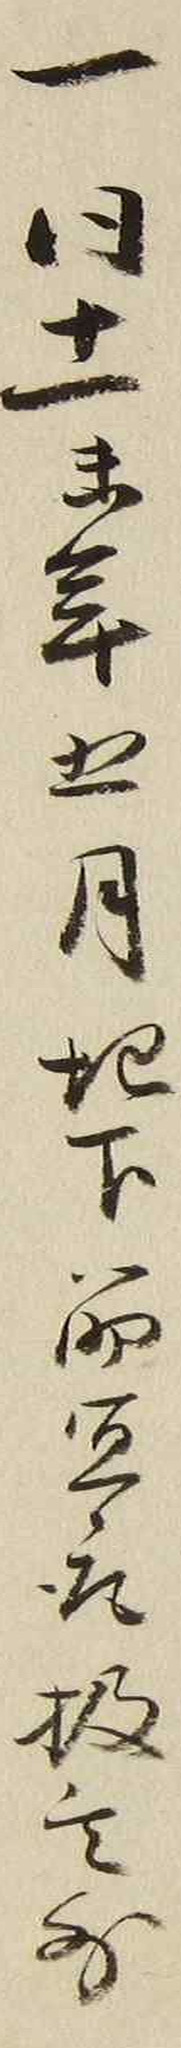一同十一未年五月地下筋宜取扱其外
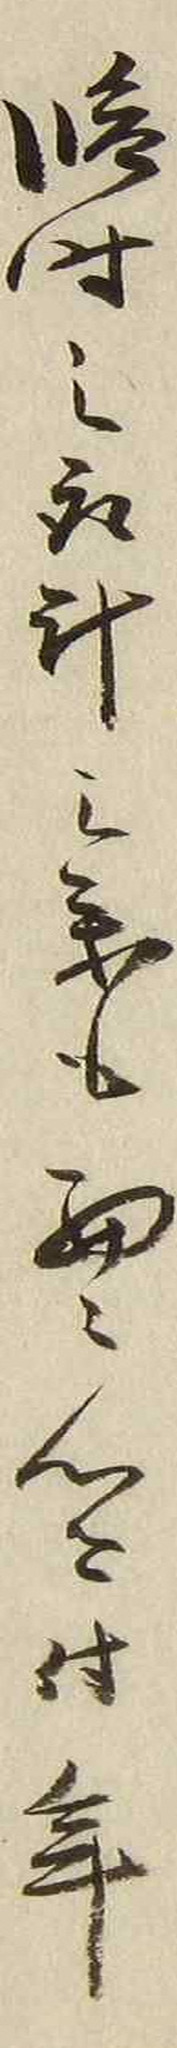臨時之取計之義も細々心を付年
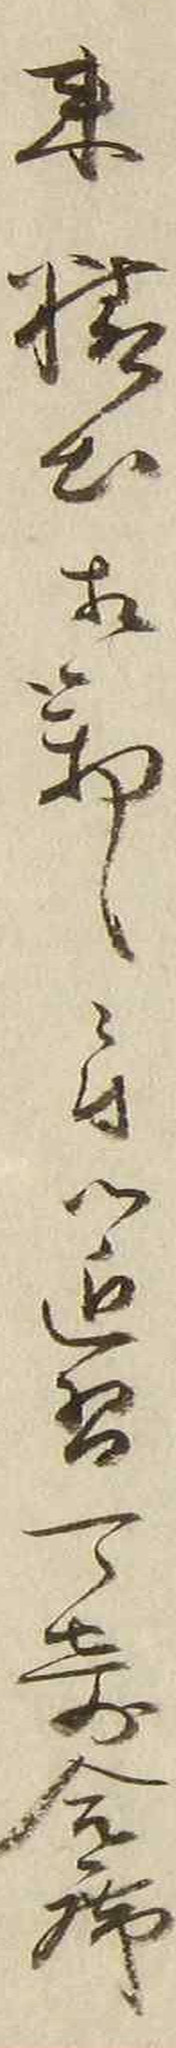来精出相勤候ニ付御近習一ノ寄合席

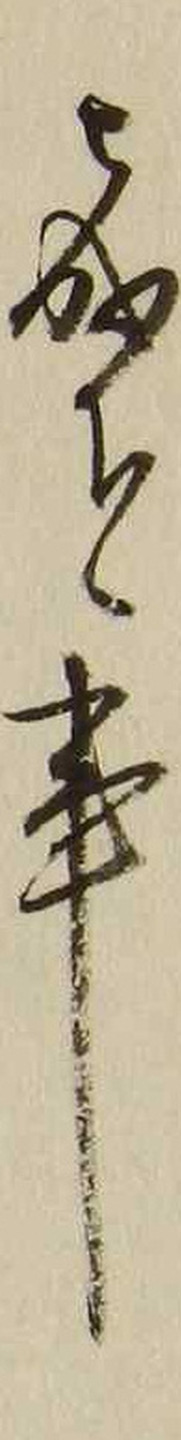被成下候事
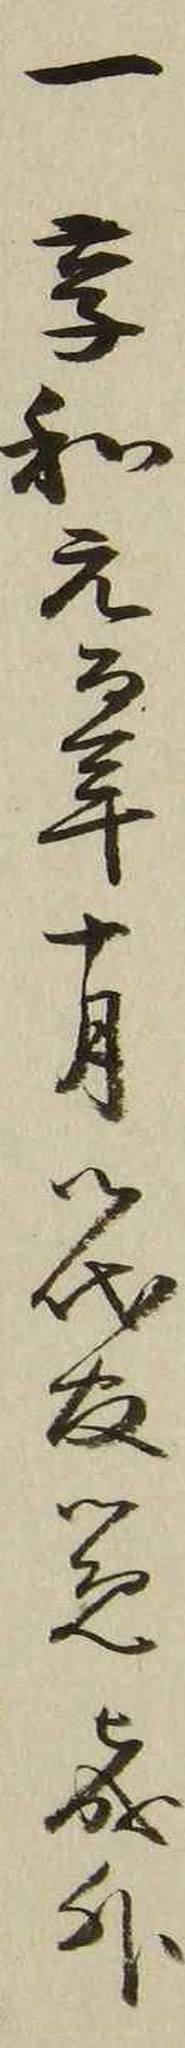一享和元酉年十月御代官御免被成外
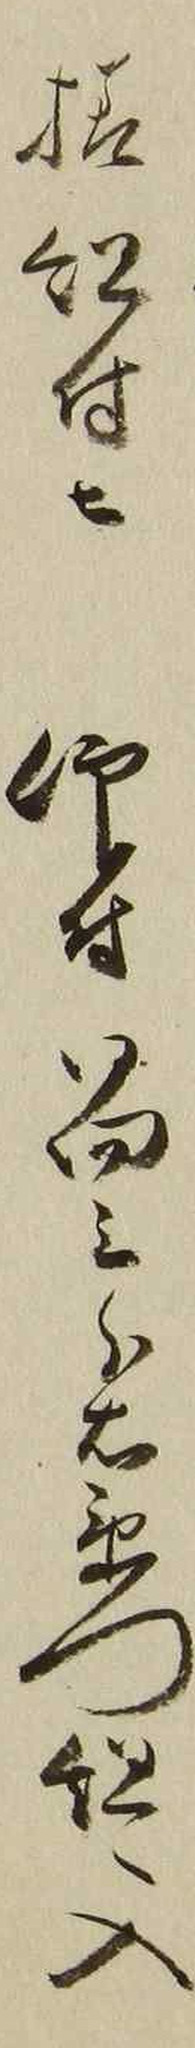様組付被仰付日向三郎右衛門組へ入
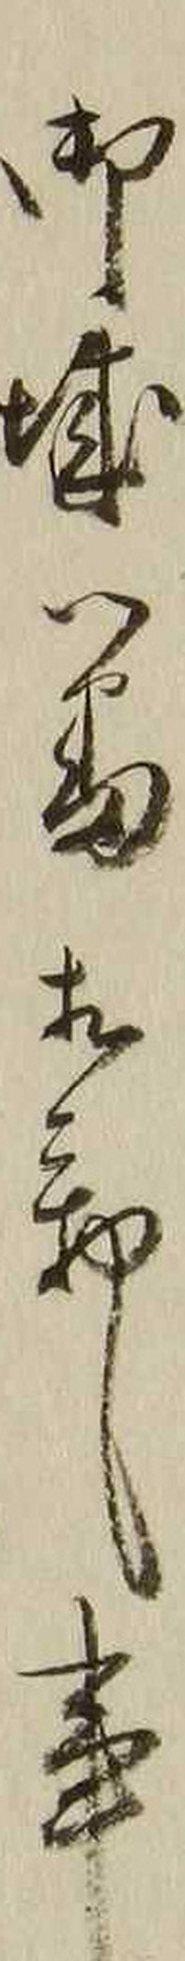御城御番相勤候事
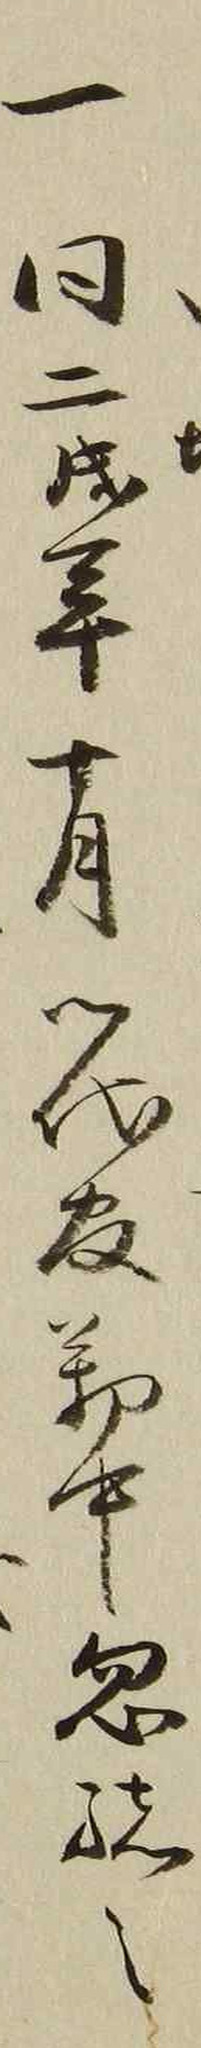一同二戌年十月御代官勤中忽緒之
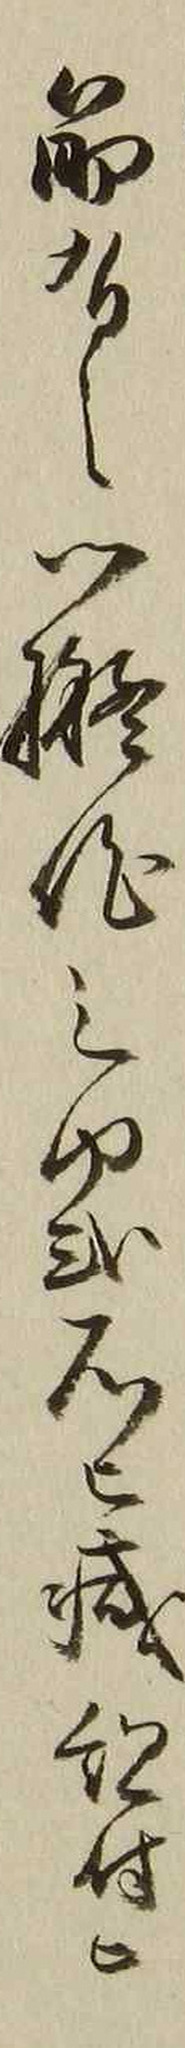筋有之御擬作之内弐石被減組付被
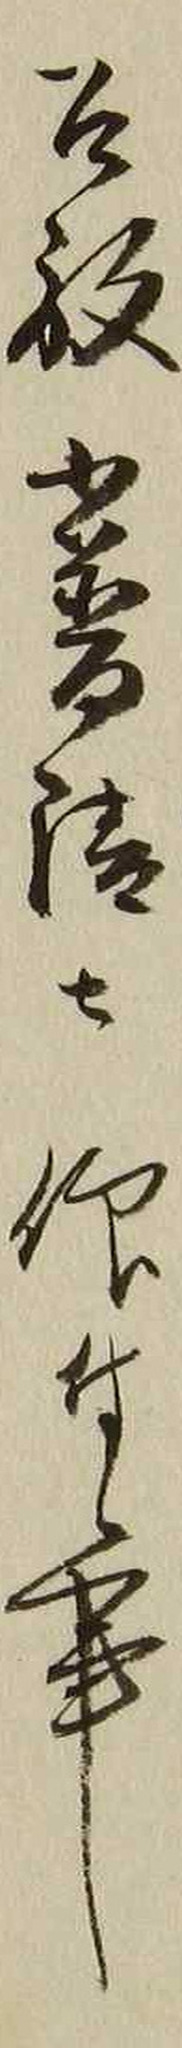召放小普請被仰付候事
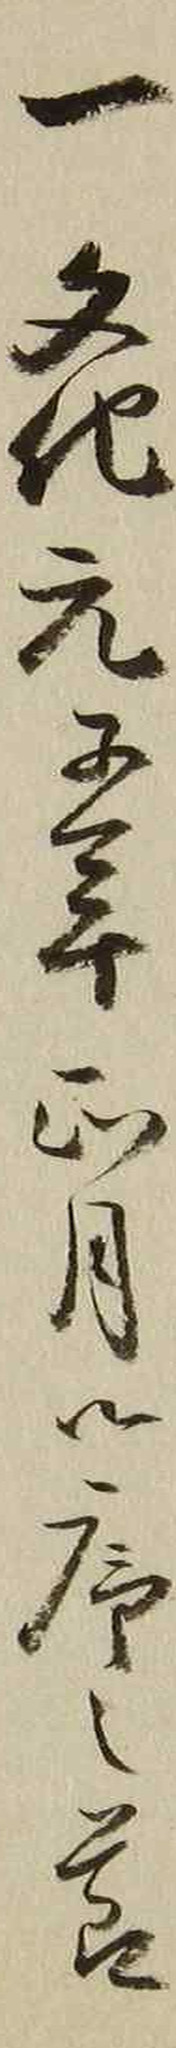一文化元子年正月御序之節
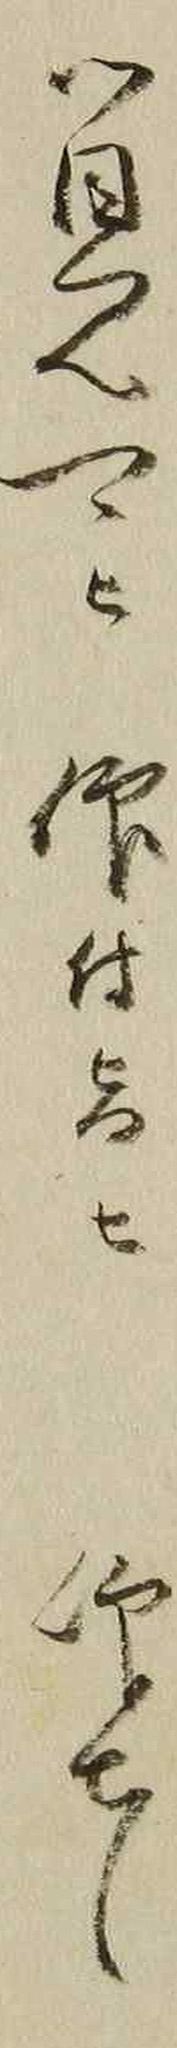御目見可被仰付旨被仰出候
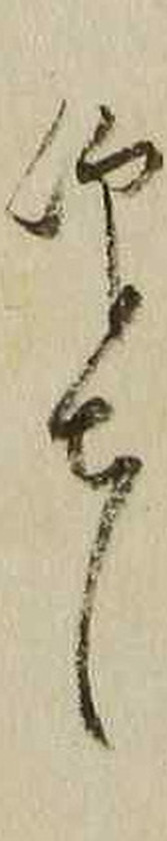仰付候
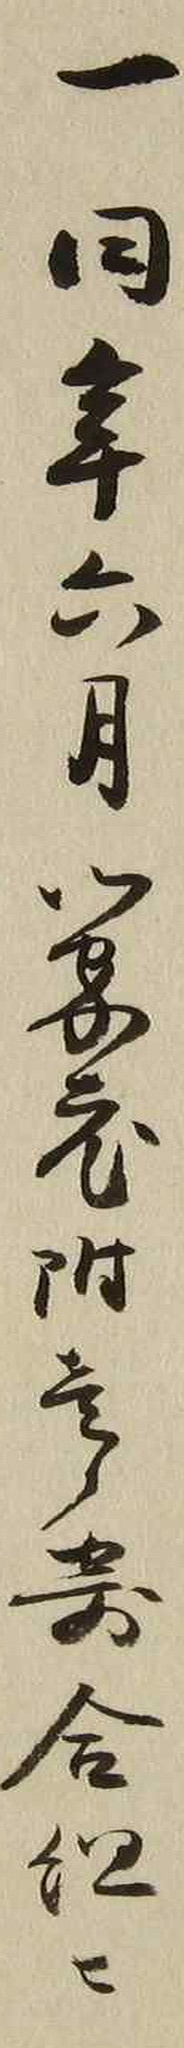一同年六月御家老附壱ノ寄合組被
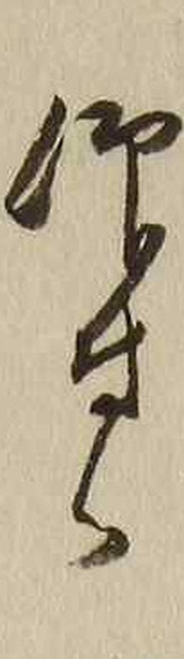仰付候
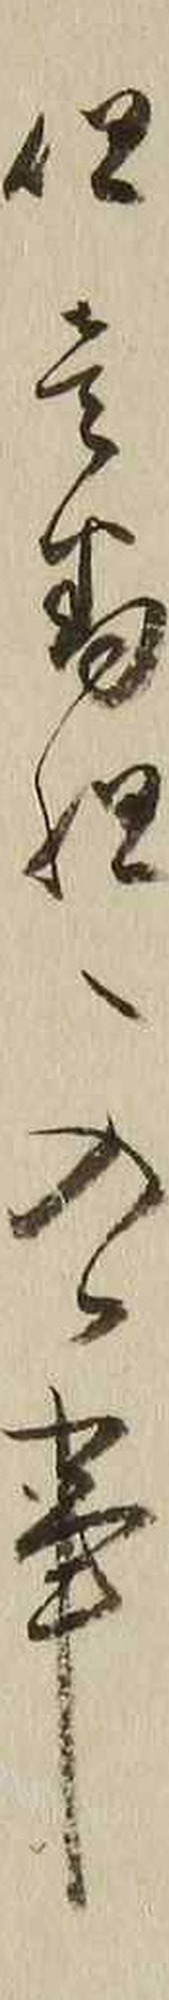但壱番組へ入候事
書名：諸士系譜　巻之288　さ之部20
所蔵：会津若松市立会津図書館
